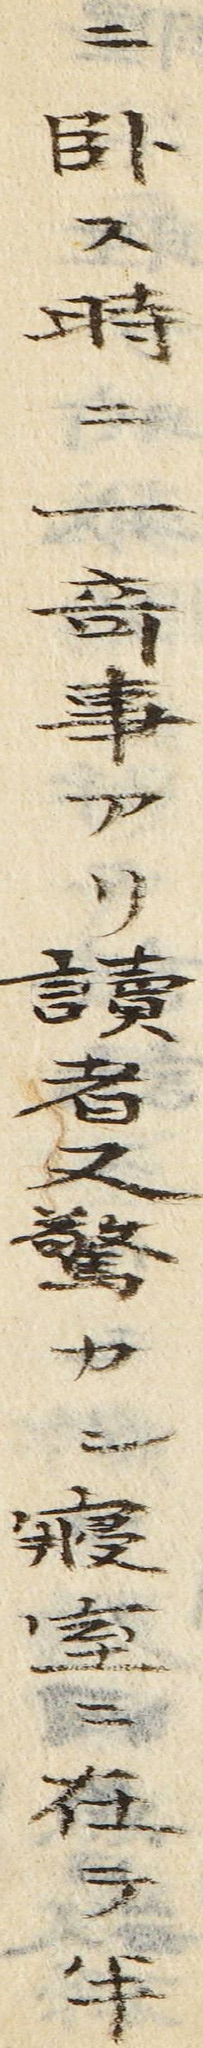ニ臥ス時ニ一奇事アリ読者又驚カン寝室ニ在テ半

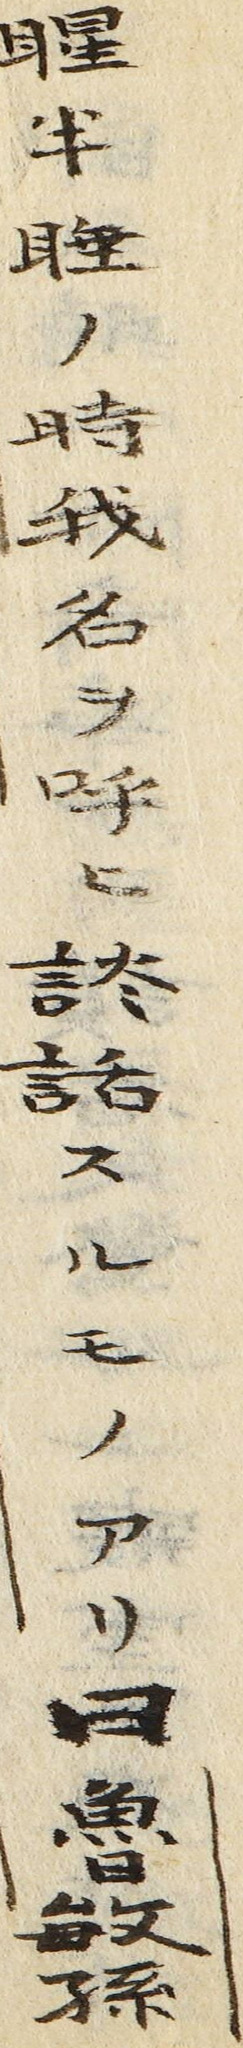腥半睡ノ時我名ヲ呼ヒ談話スルモノアリ曰魯敏孫
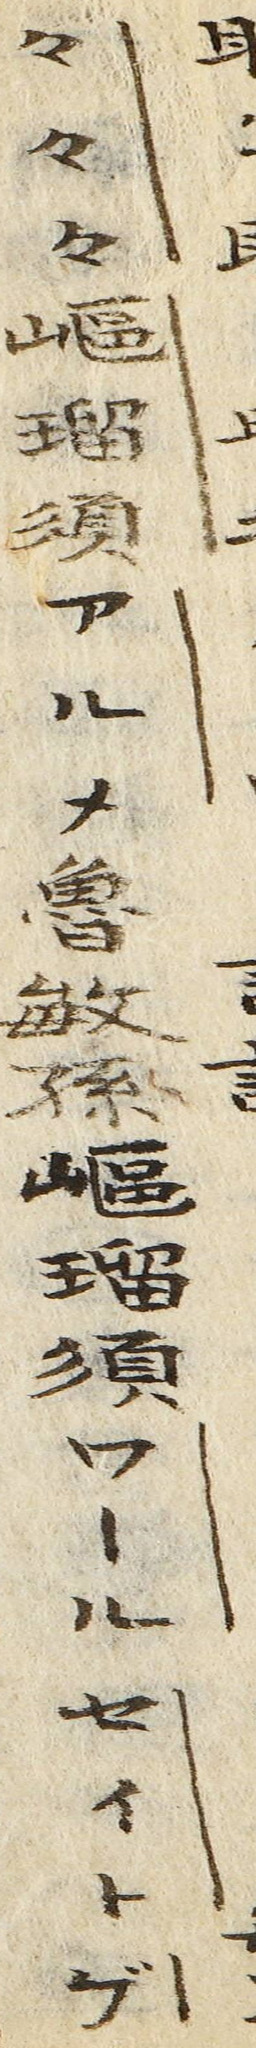々々々嶇瑠須アルメ魯敏孫嶇瑠須ワールセイトゲ
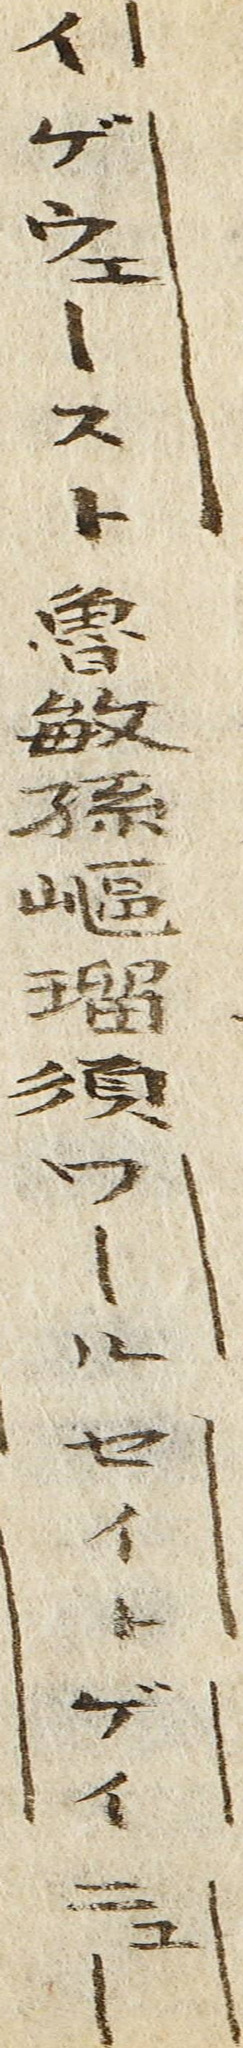イゲウエースト魯敏孫嶇瑠須ワールセイトゲイニユー
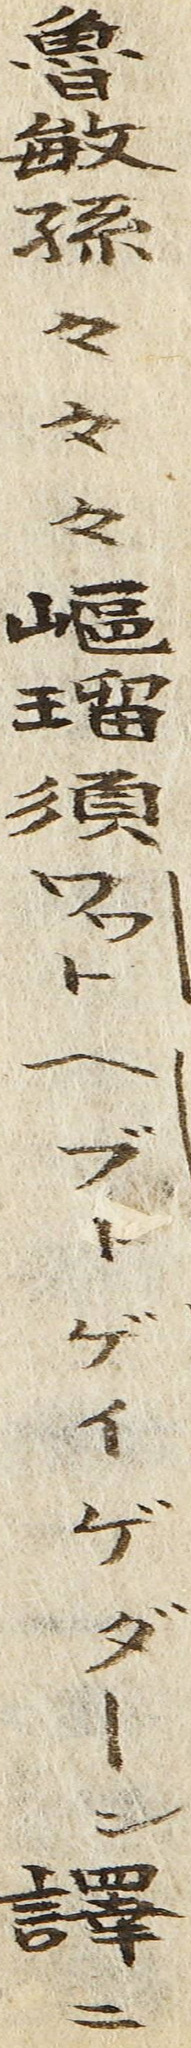魯敏孫々々々嶇瑠須ワツトヘブーゲイゲダーン訳ニ
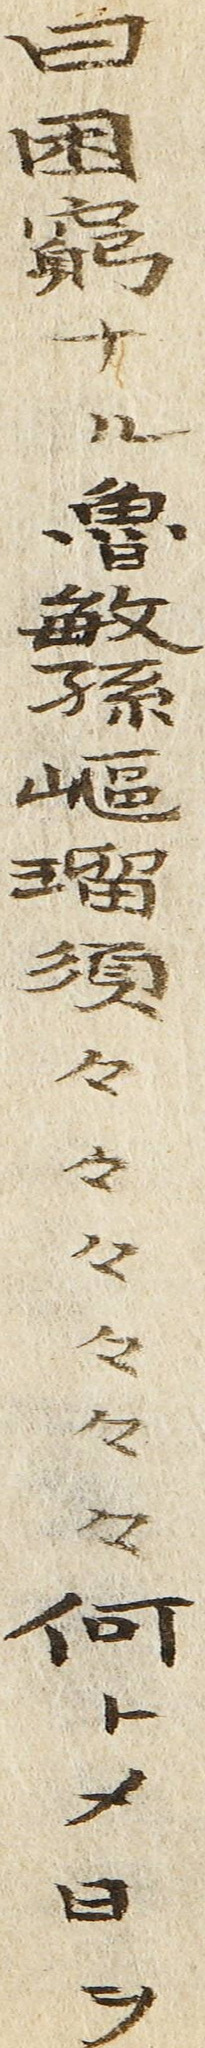曰困窮ナル魯敏孫嶇瑠須々々々々々々何トシテ日ヲ
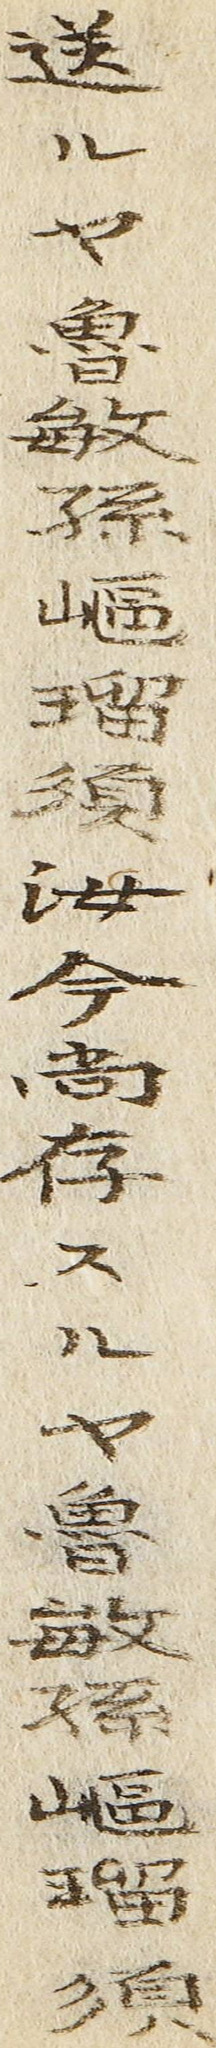送ルヤ魯敏孫嶇瑠須汝今尚存スルヤ魯敏孫嶇瑠須
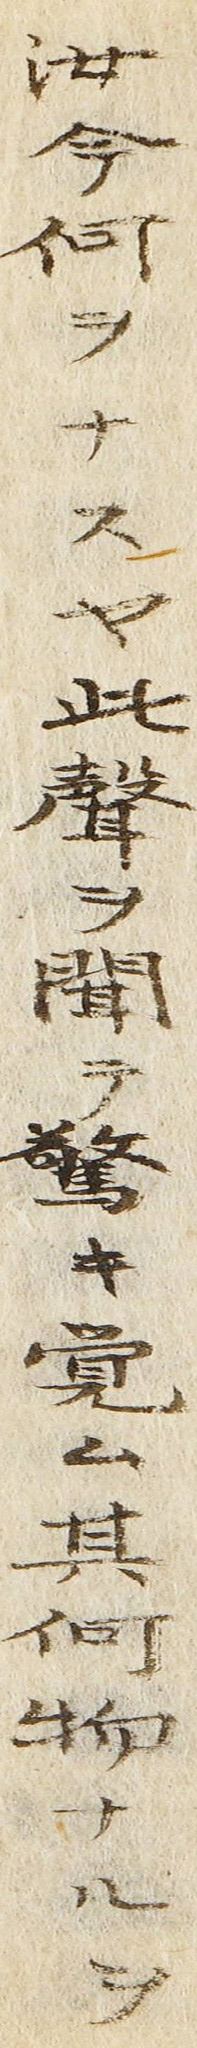汝今何ヲナスヤ此声ヲ聞テ驚キ覚ム其何物ナルヲ
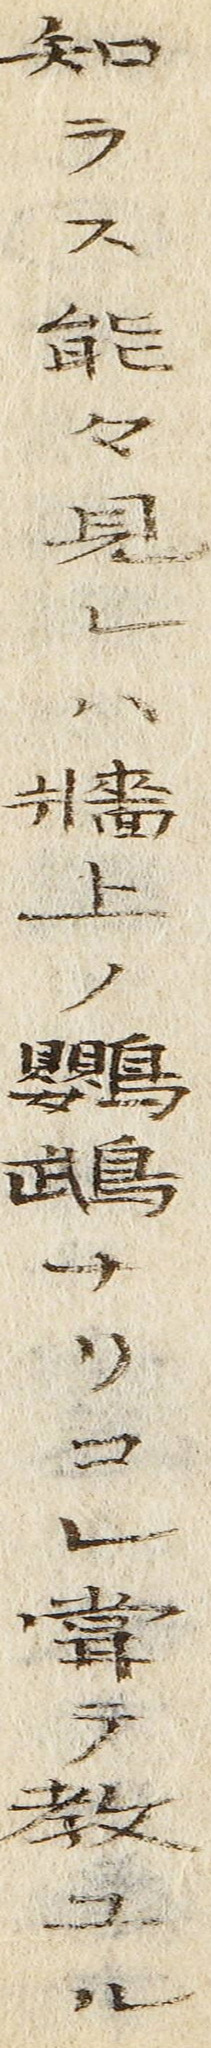知ラス能々見レハ牆上ノ鸚鵡ナリコレ嘗テ教ユル
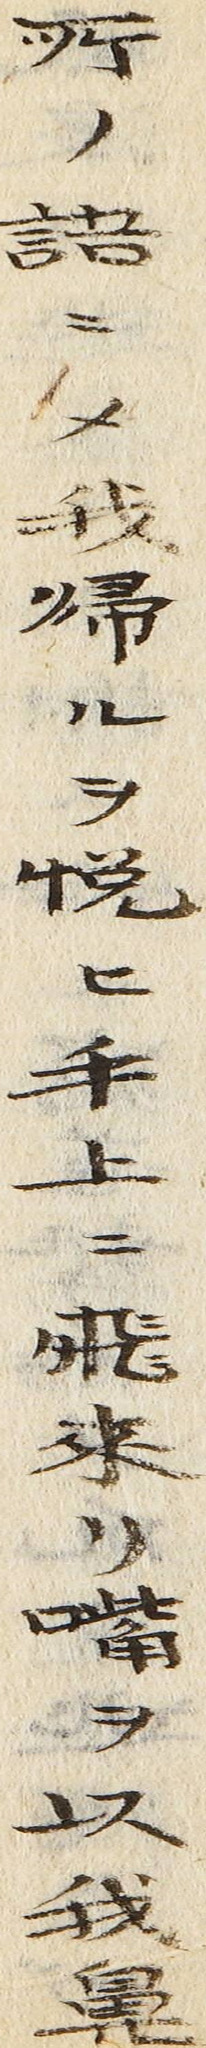所ノ語ニシテ我帰ルヲ悦ヒ手上ニ飛来リ嘴ヲ以我鼻
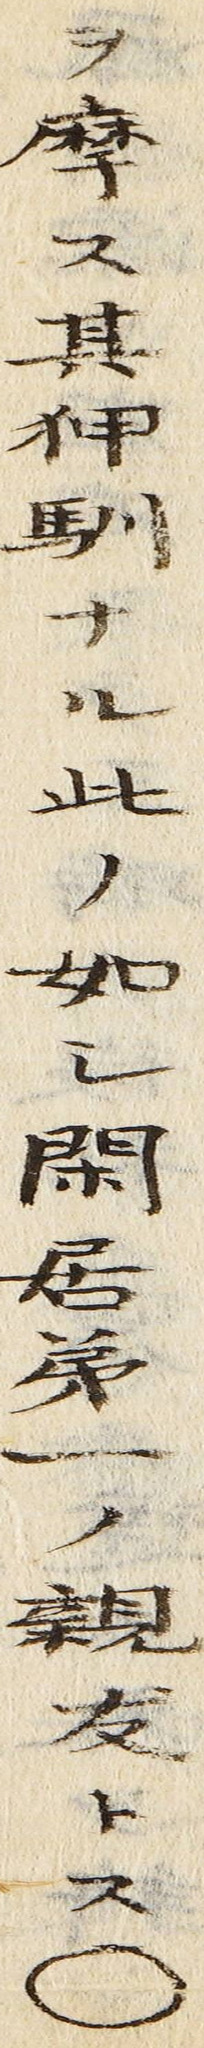ヲ摩ス其狎馴ナル此ノ如シ閑居第一ノ親友トス◯
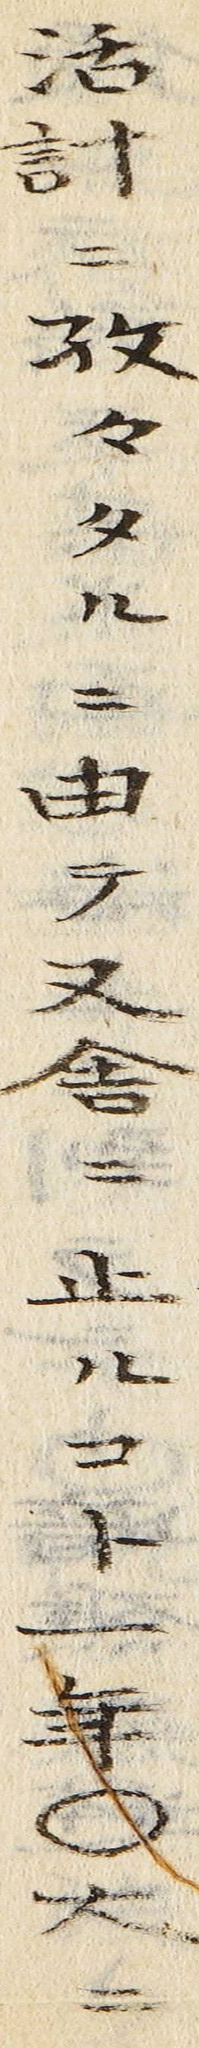活計ニ孜々タルニ由テ又舎ニ止ルコト一年◯大ニ
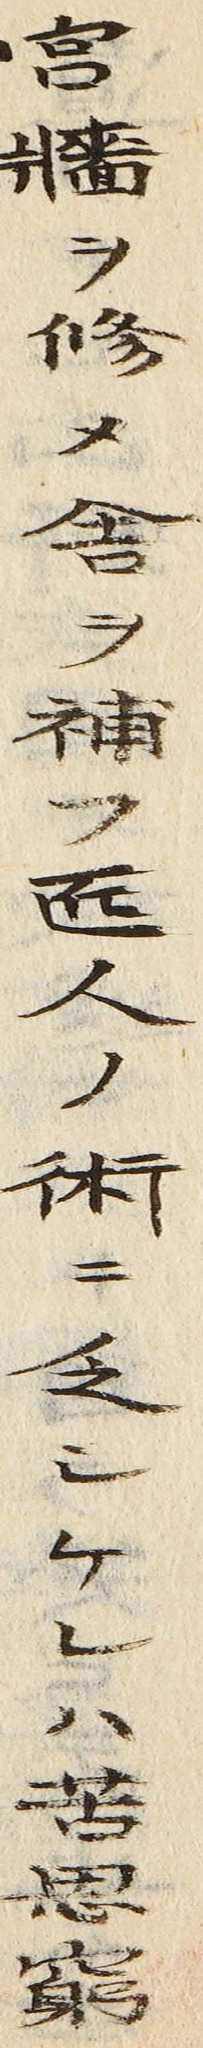宮牆ヲ修シテ舎ヲ補フ匠人ノ術ニ乏シケレハ苦思窮
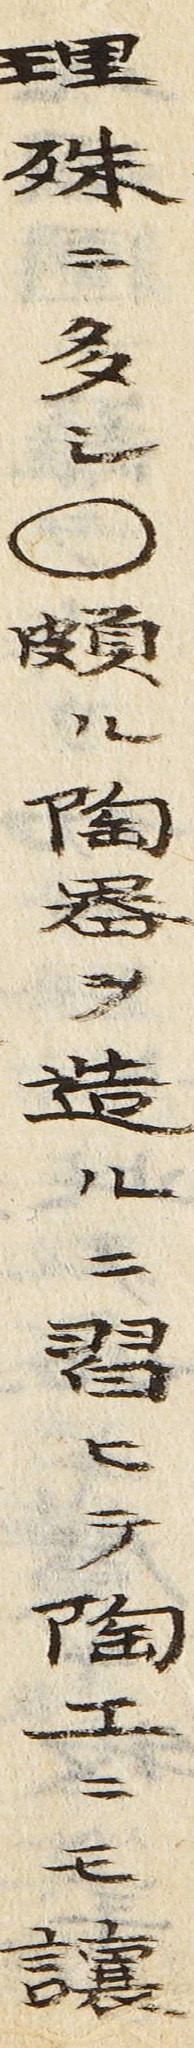理殊ニ多シ◯頗ル陶器ヲ造ルニ習ヒテ陶工ニモ譲
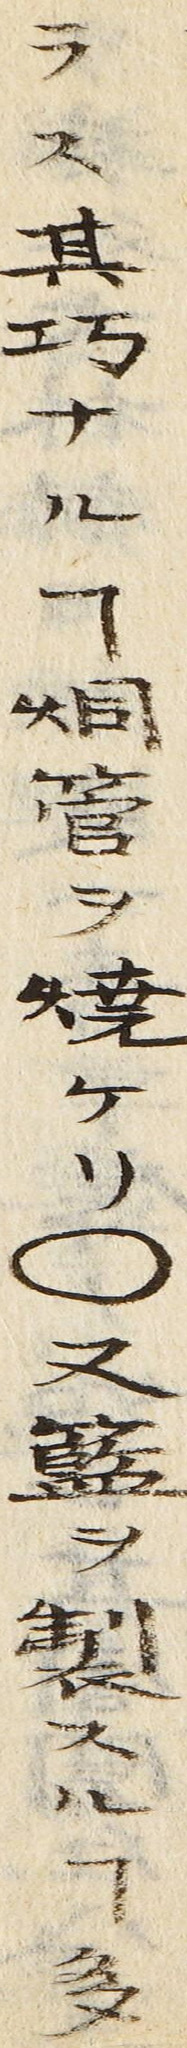ラス其巧ナルコト煙管ヲ焼ケリ◯又籃ヲ製スルコト多
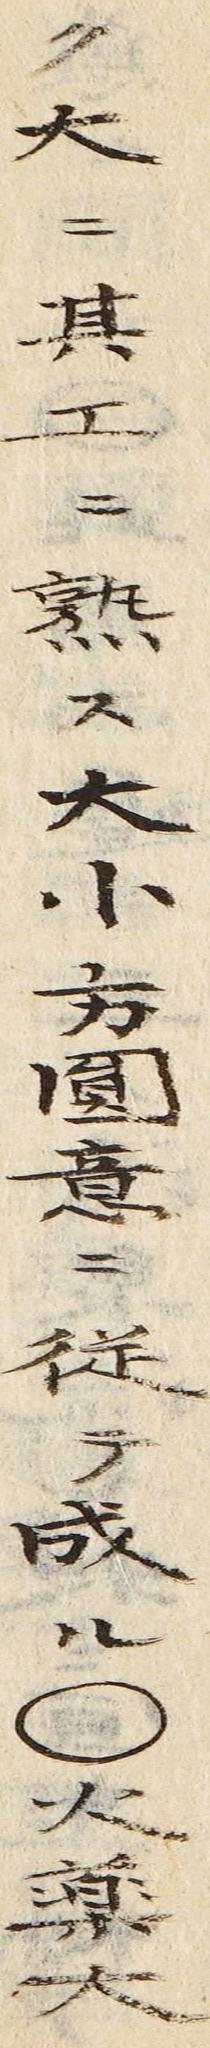ク大ニ其工ニ熟ス大小方円意ニ従テ成ル◯火薬大
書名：漂流紀事
